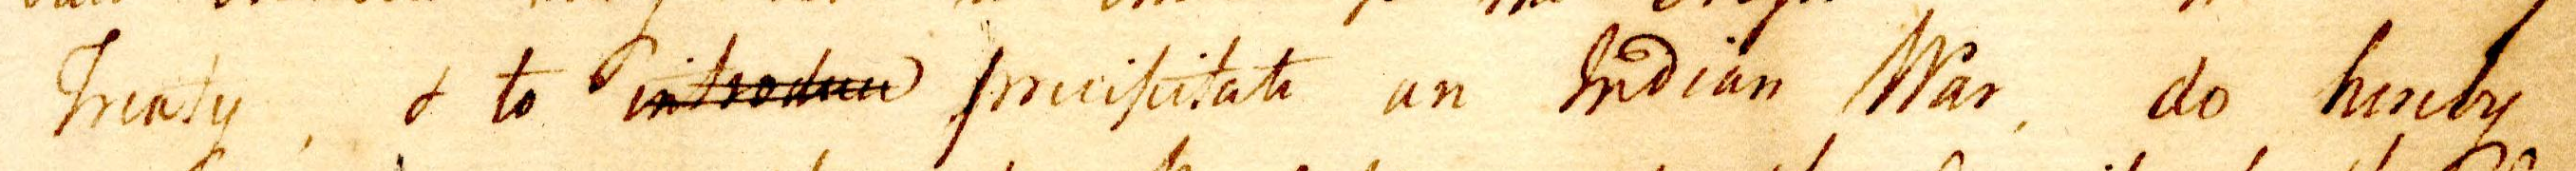Treaty & to introduce precipitate an Indian War do hereby
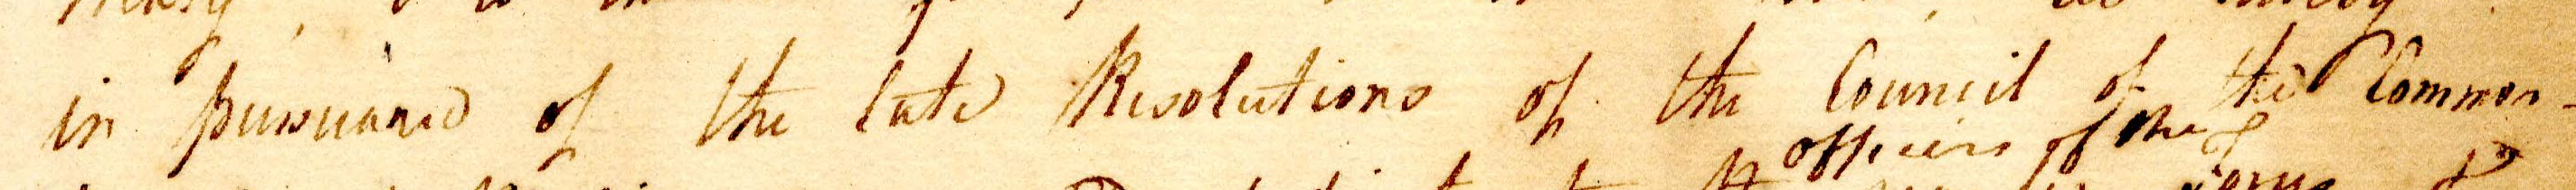in pursuance of the late Resolutions of the Council of the Common
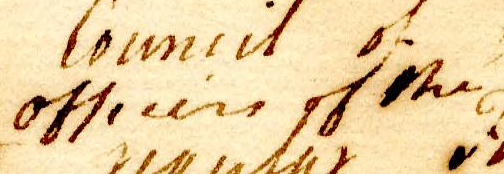officers of the
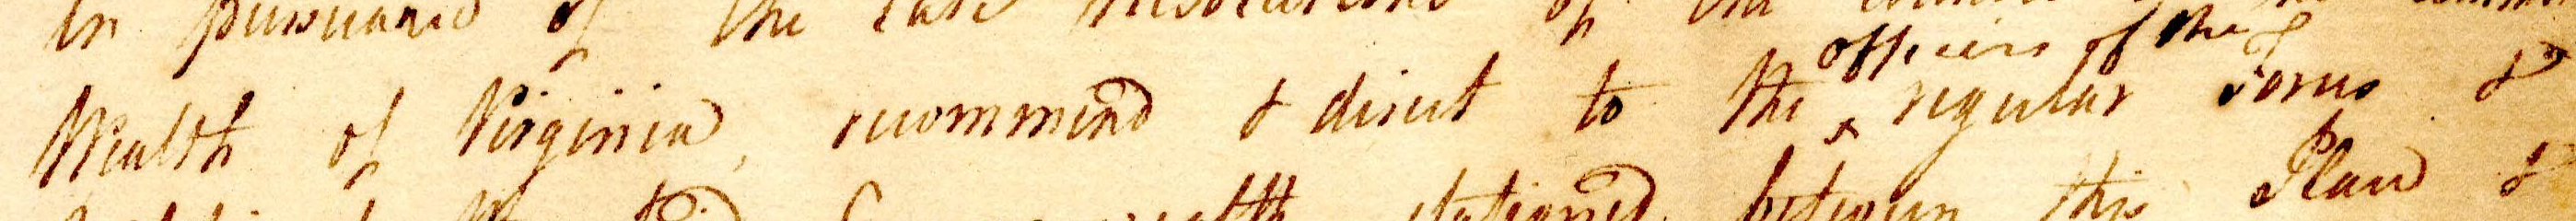Wealth of Virginia recommend & direct to the ^ regular Forms &
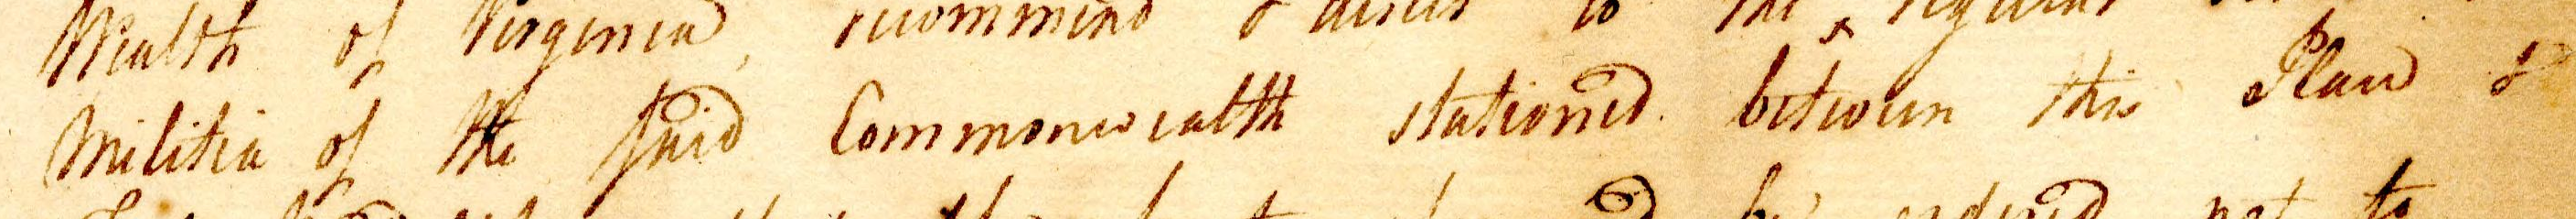Militia of the said Commonwealth stationed between this Place &
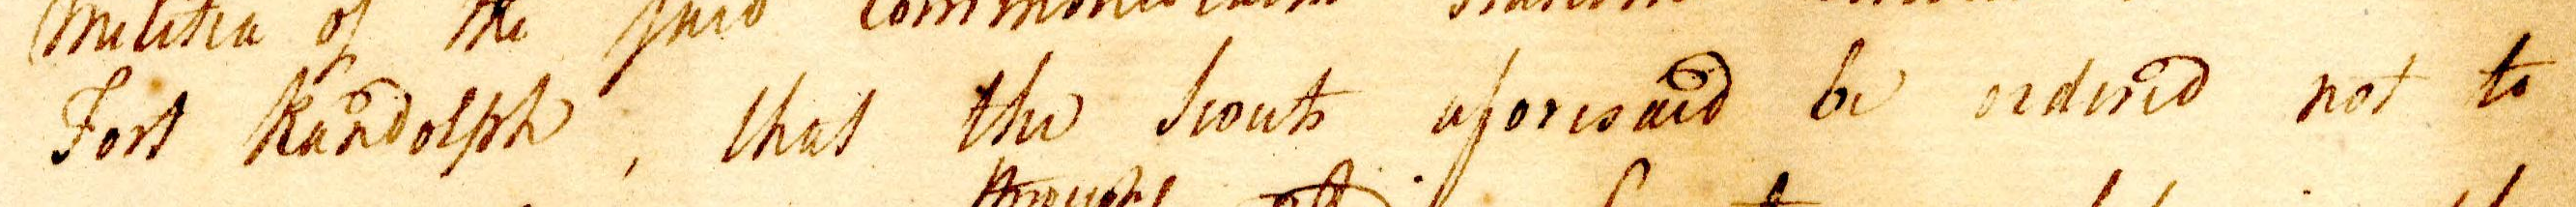Fort Randolph, that the Scouts aforesaid be ordered not to
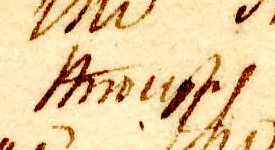through
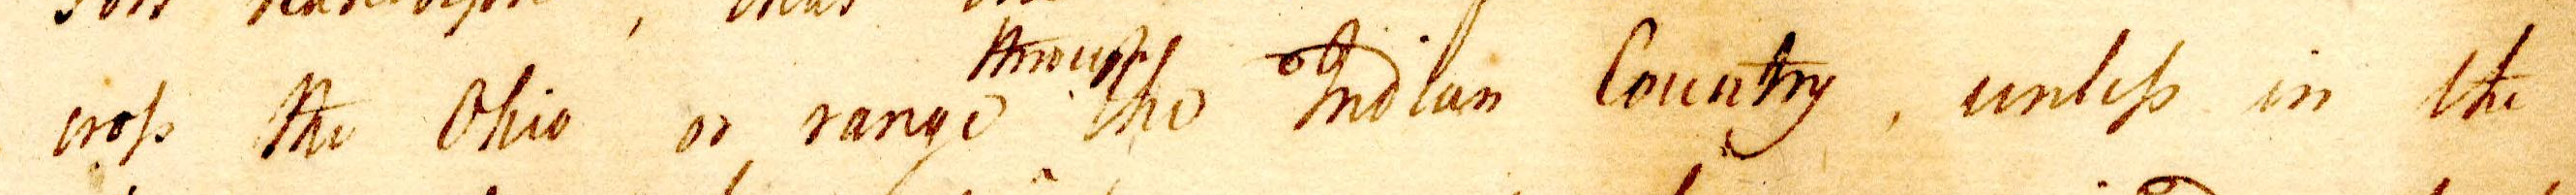cross the Ohio or range ^ the Indian Country, unless in the
